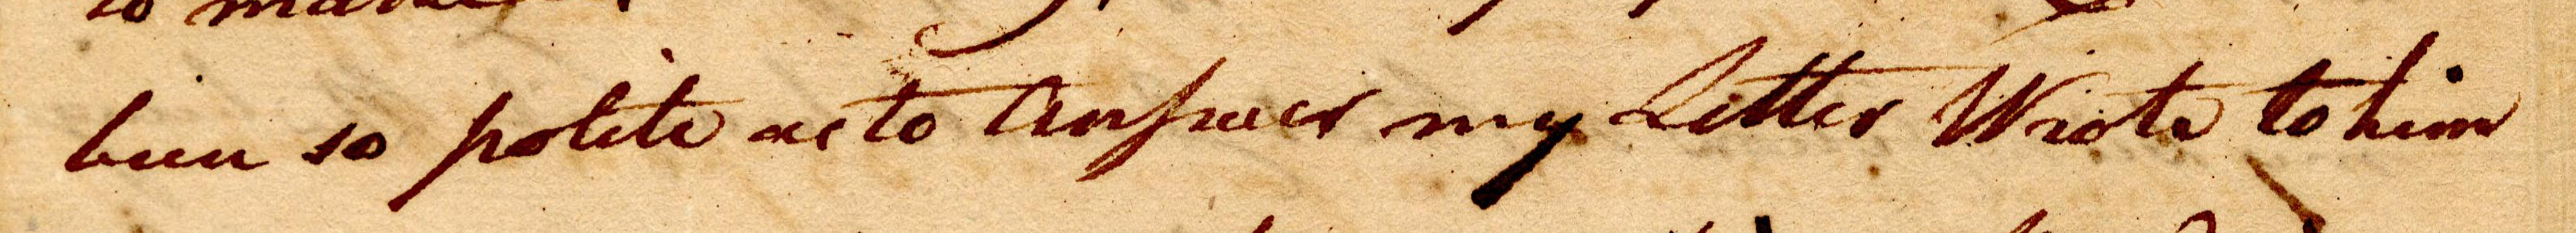been so polite as to answer my Letter Wrote to him
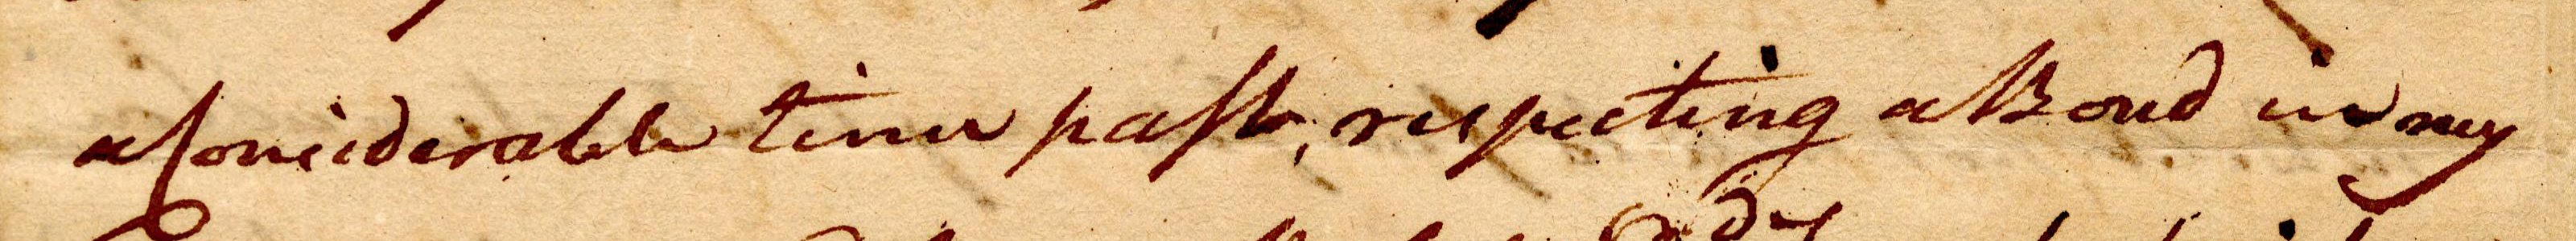a Considerable tine past, respecting a Bond in my
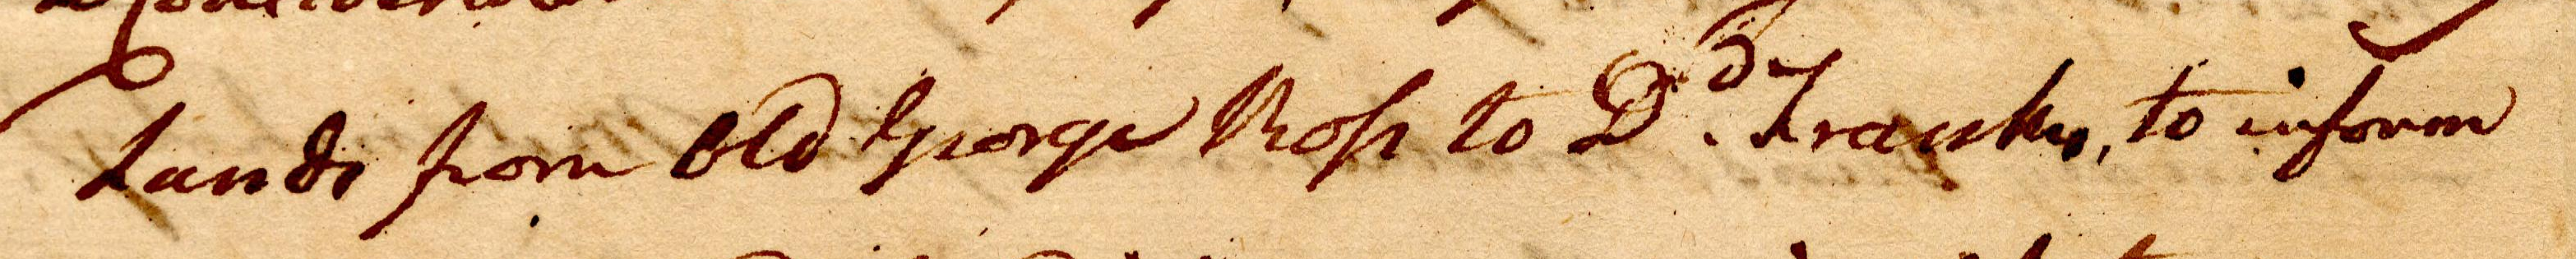Lands from Old George Ross to D^d. Franks to inform
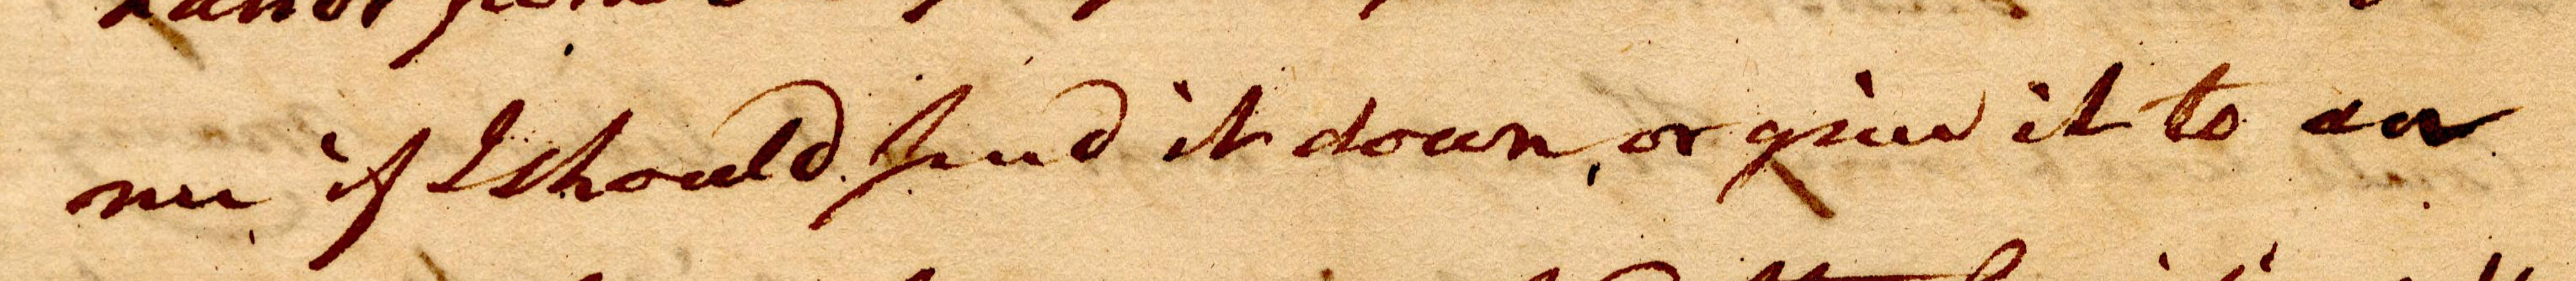me if I should send it down, or give it to an
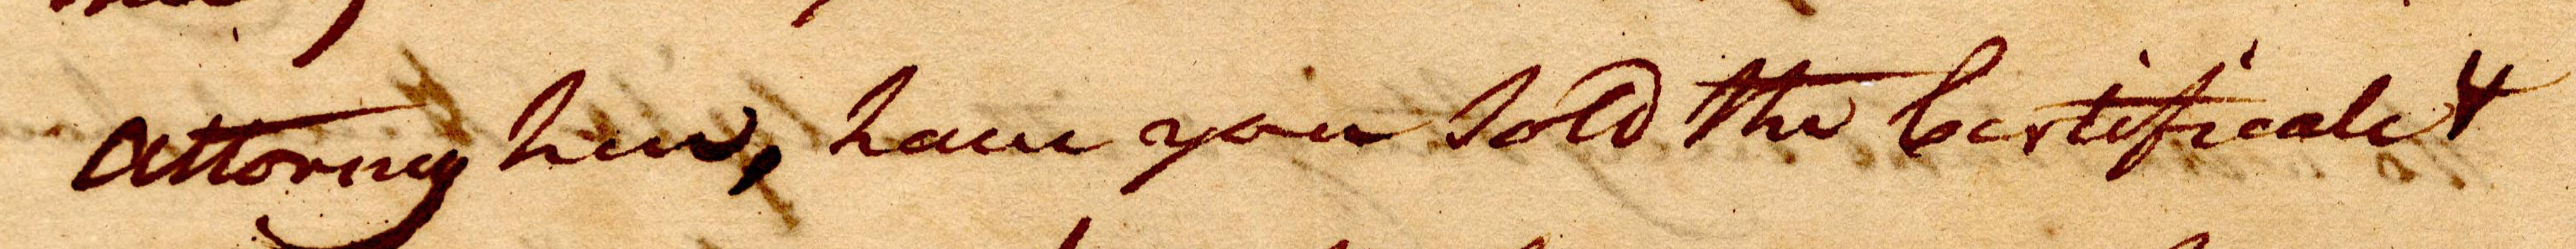attorny here, have you Sold the Certificate
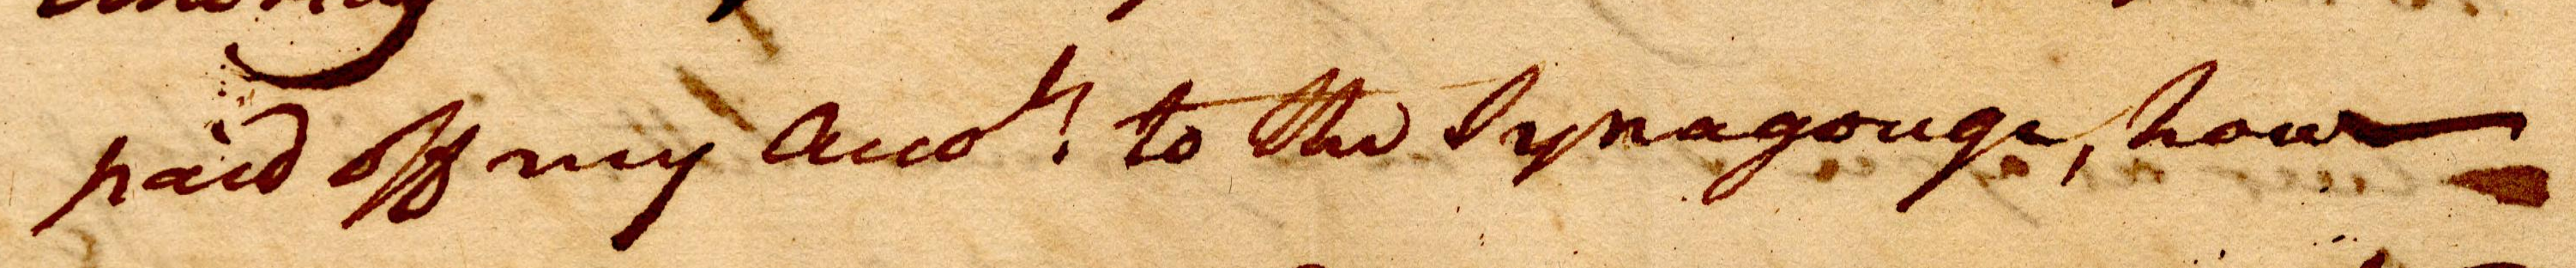paid off my Acco^t to the synagogue, how
